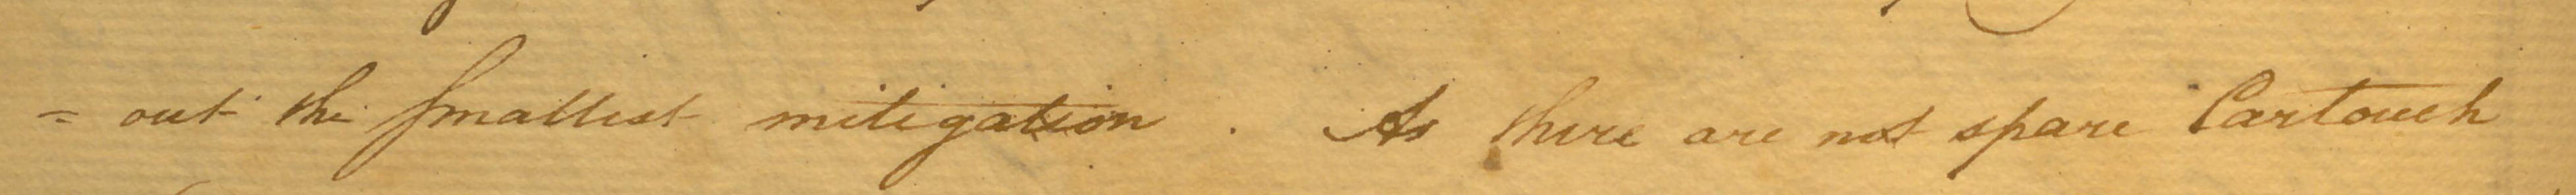-out the smallest mitigation. As there are not spare Cartouch
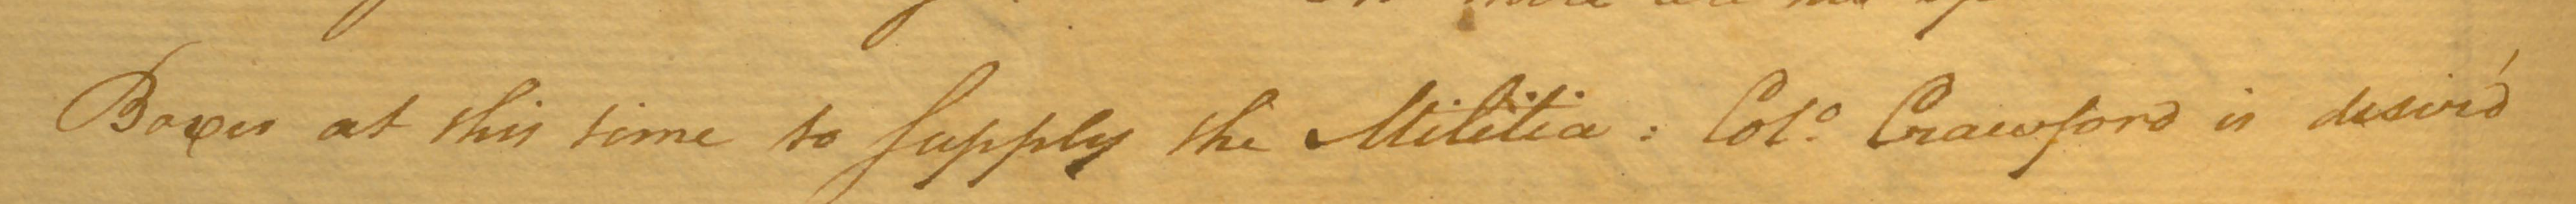Boxes at this time to supply the Militia: Col^o. Crawford is desir'd
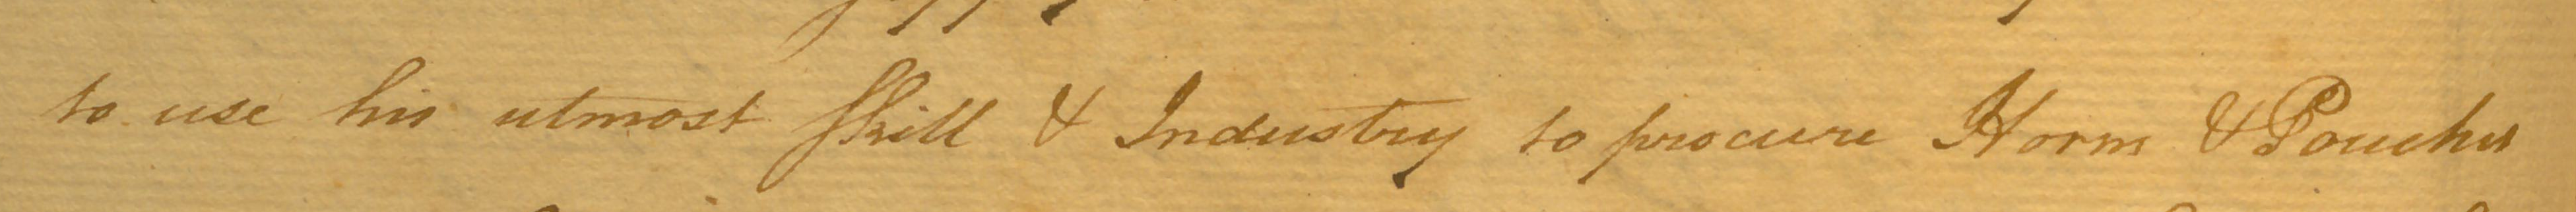to use his utmost skill & Industry to procure Horns & Pouches
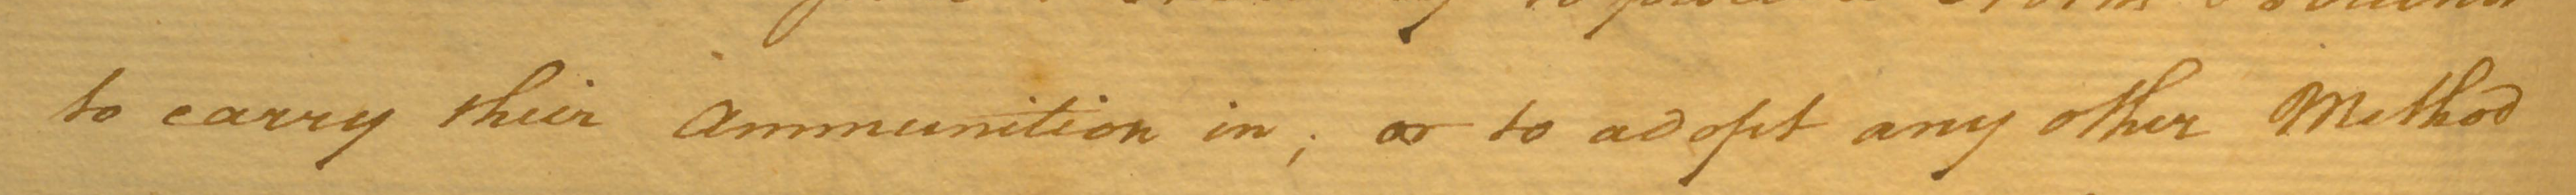to carry their ammunition in; or to adopt any other Method
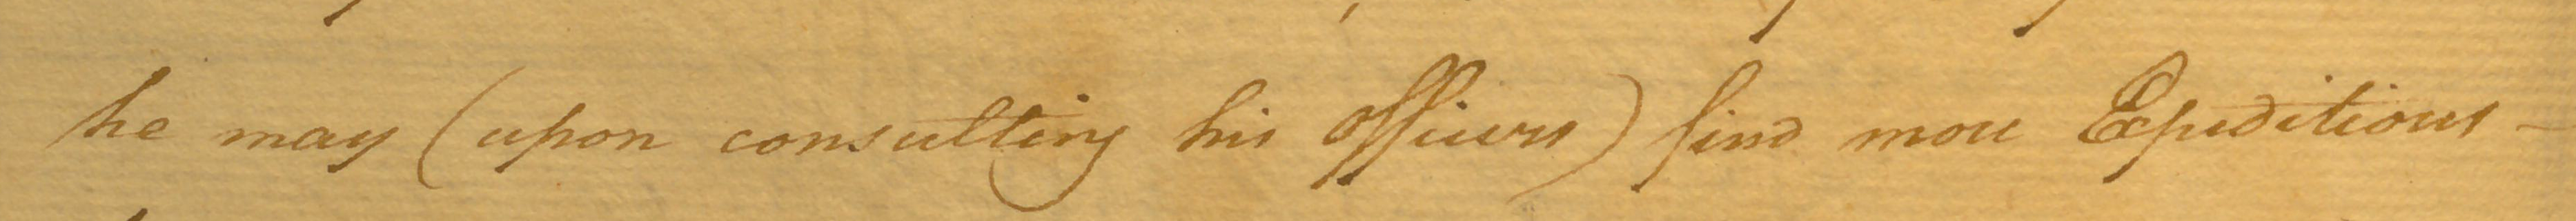he may (upon consulting his officers) find more Expeditious-
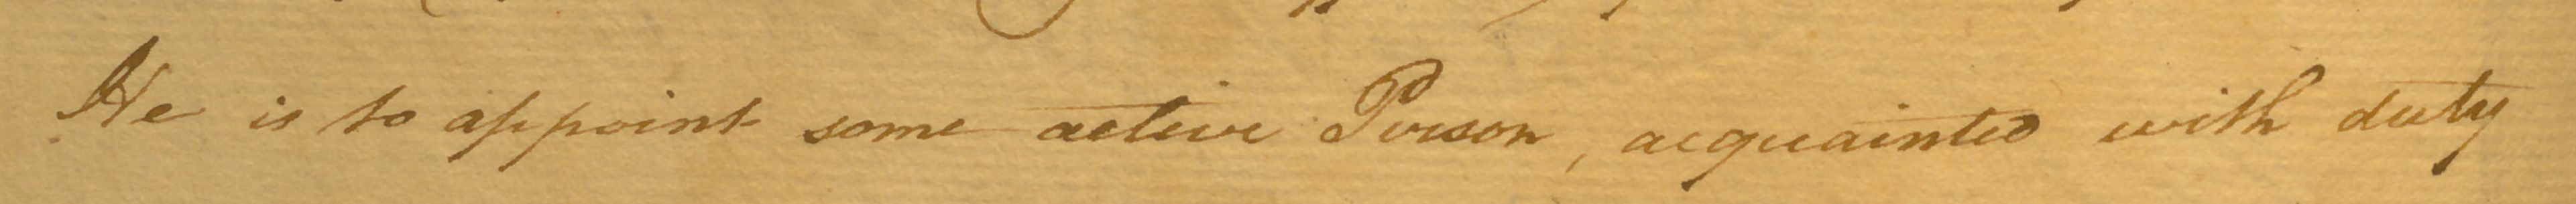He is to appoint some active Person, acquainted with duty
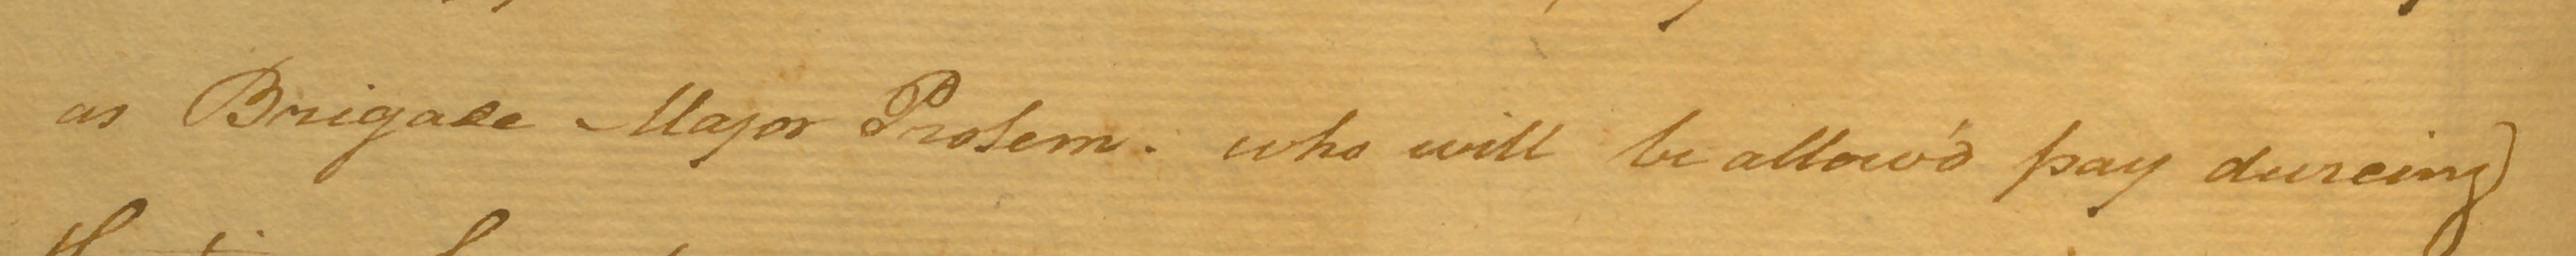as Brigade Major Protem who will be allow'd pay during
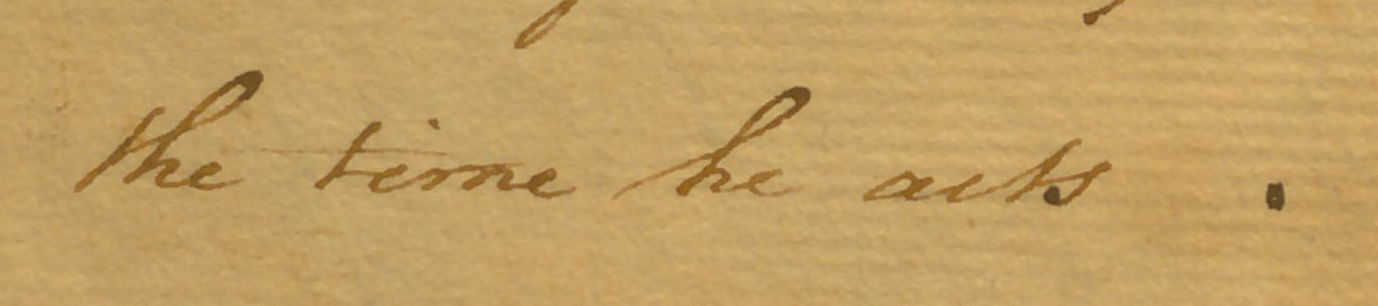the time he acts.
